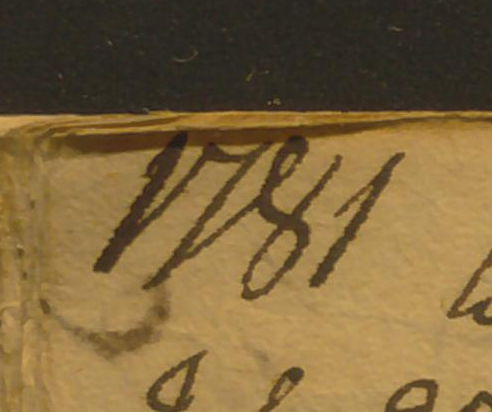1781
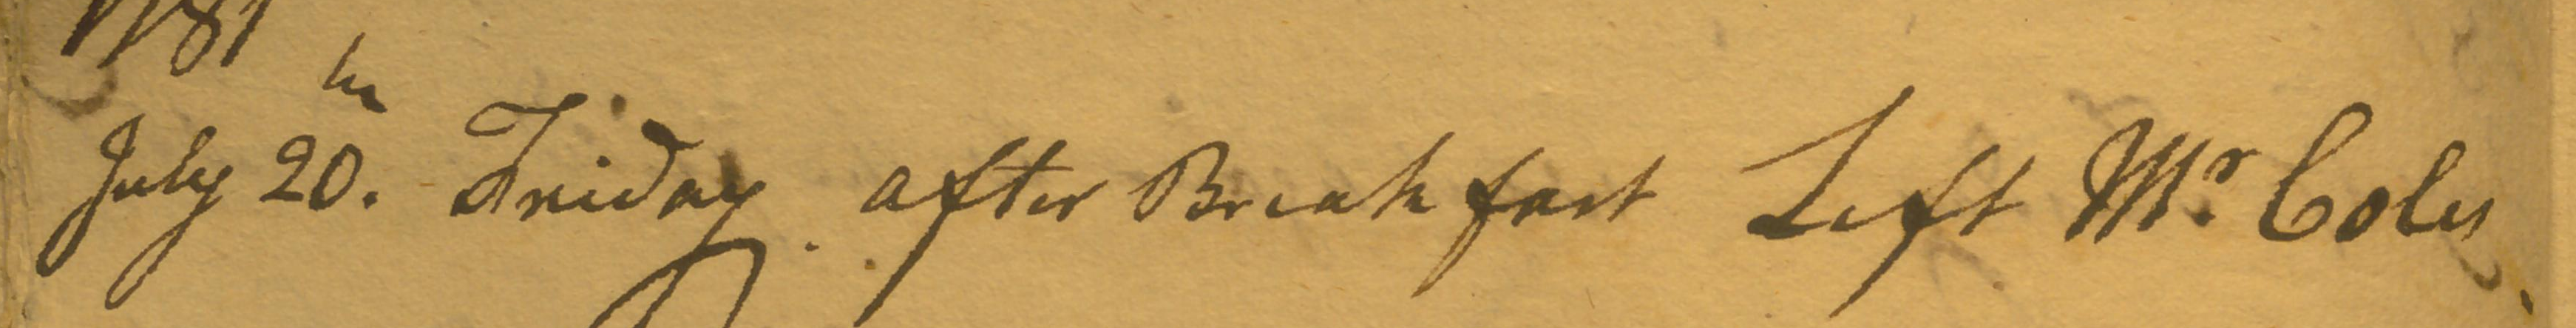July 20^th. Friday after Breakfast Left M^r. Coles
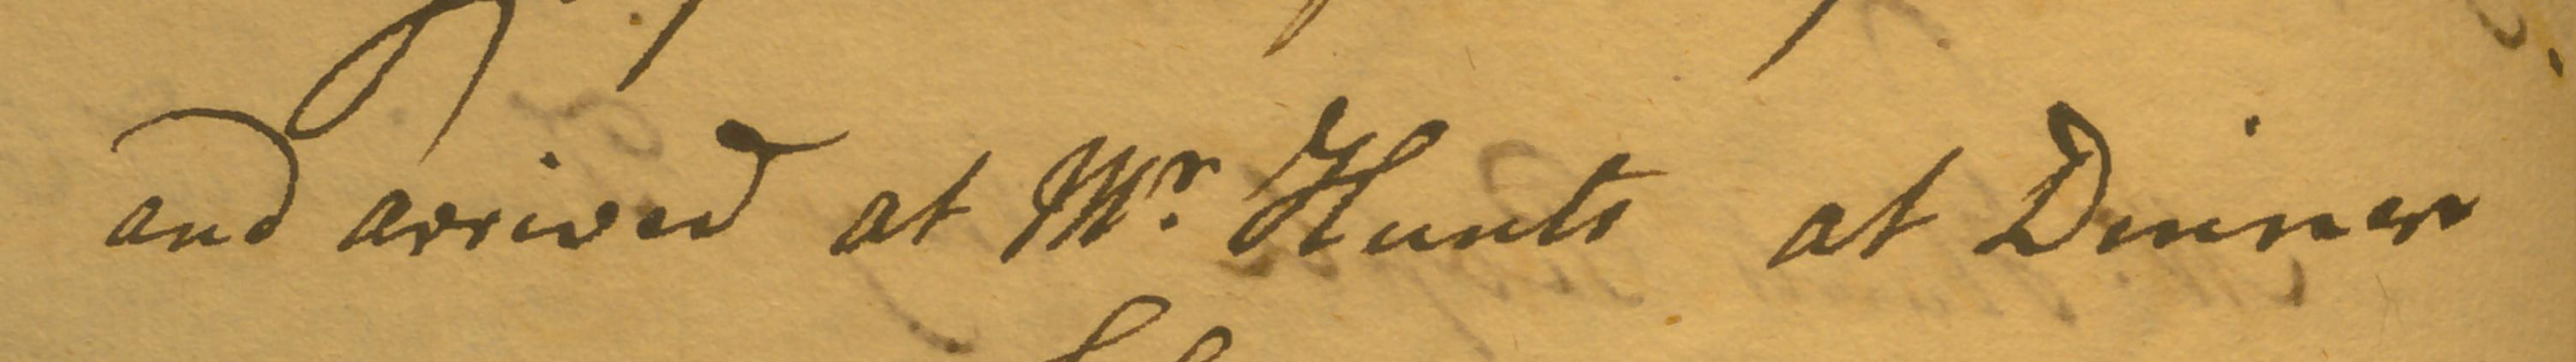and arrived at M^r. Hunts at Dinner
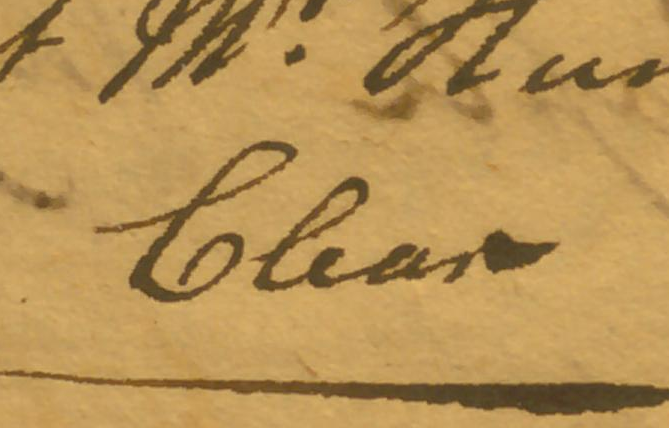Clear
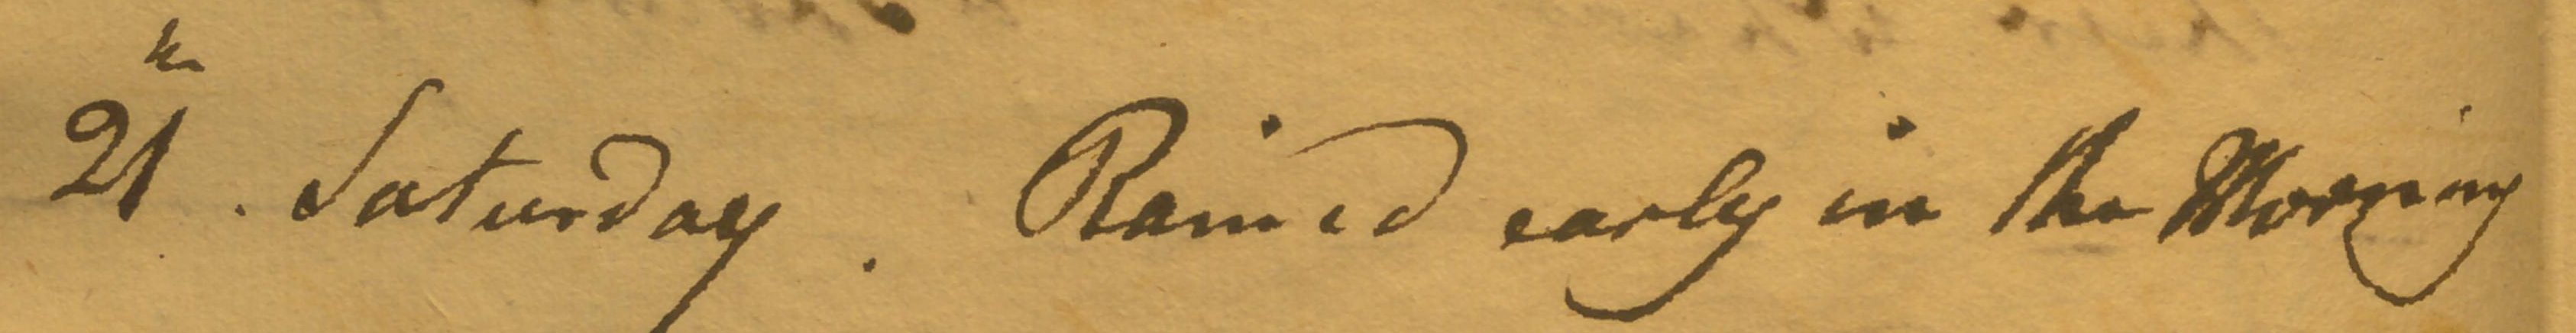21^th. Saturday Rained early in the Morning
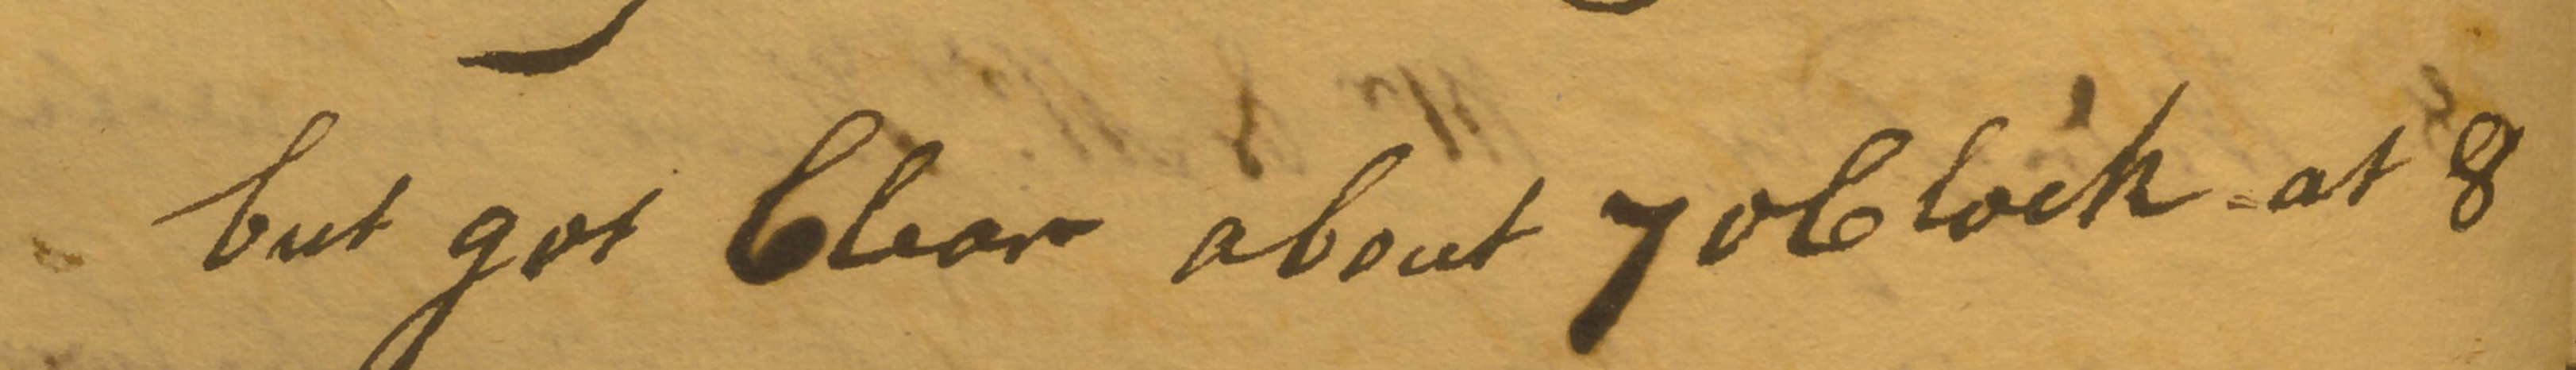but got Clear about 7 oClock at 8
